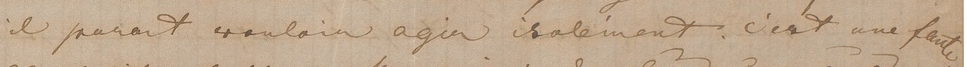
il parait vouloir agir isolément – c'est une faute.
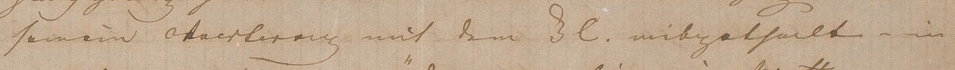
seinem Vertrag mit dem GC. mitgetheilt – in
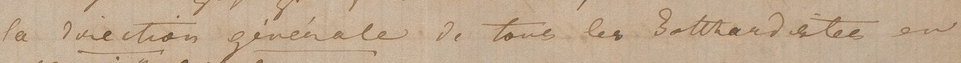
la directiongénérale de tous les Gotthardistes en
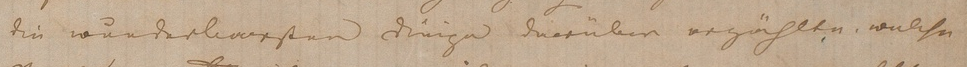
die wunderbarsten Dinge darüber erzählte – welche
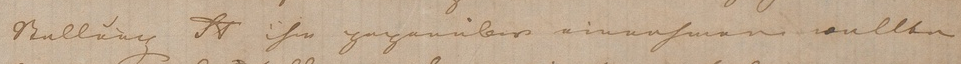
Stellung St ihm gegenüber einnehmen wollte
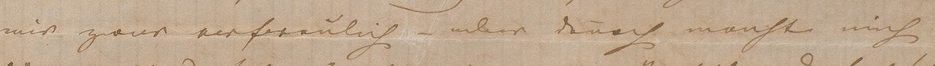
mir zwar erfreulich – aber dennoch macht mich
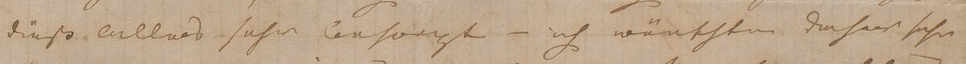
dieß Alles sehr besorgt – ich wünschte daher sehr
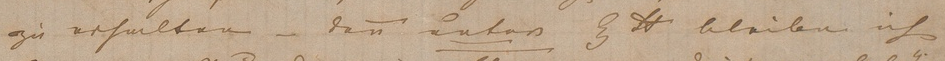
zu erhalten – denn unter Herrn St bleibe ich
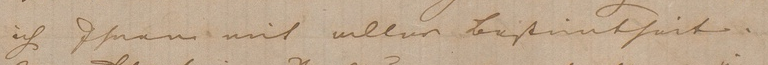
ich Ihnen mit aller Bestimtheit. –
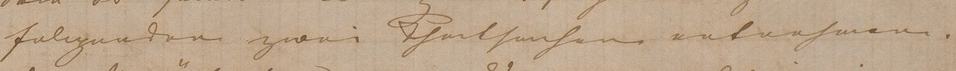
folgenden zwei Thatsachen entnehmen.
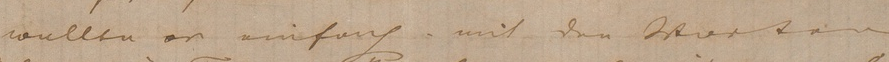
wollte er einfach – mit den Worten
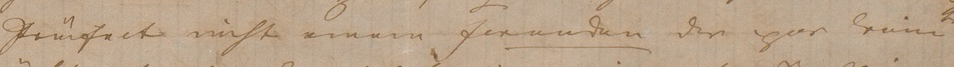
Präfect nicht einem Fremden der gar keine
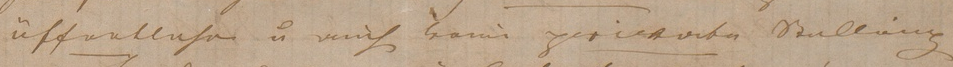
öffentliche u auch keine private Stellung
